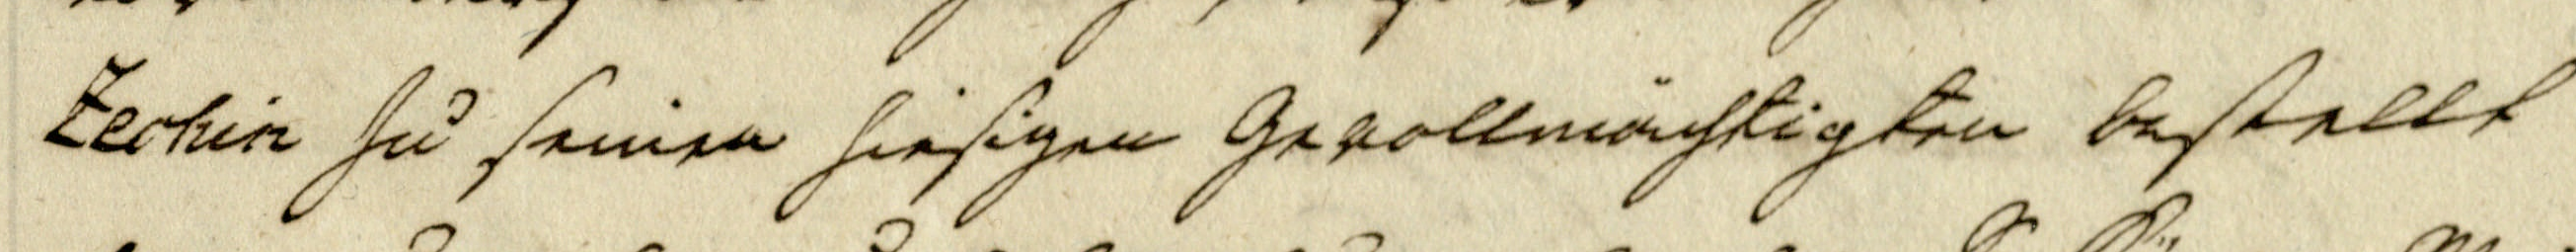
Zechin zu seinen hiesigen Gevollmächtigten bestellt
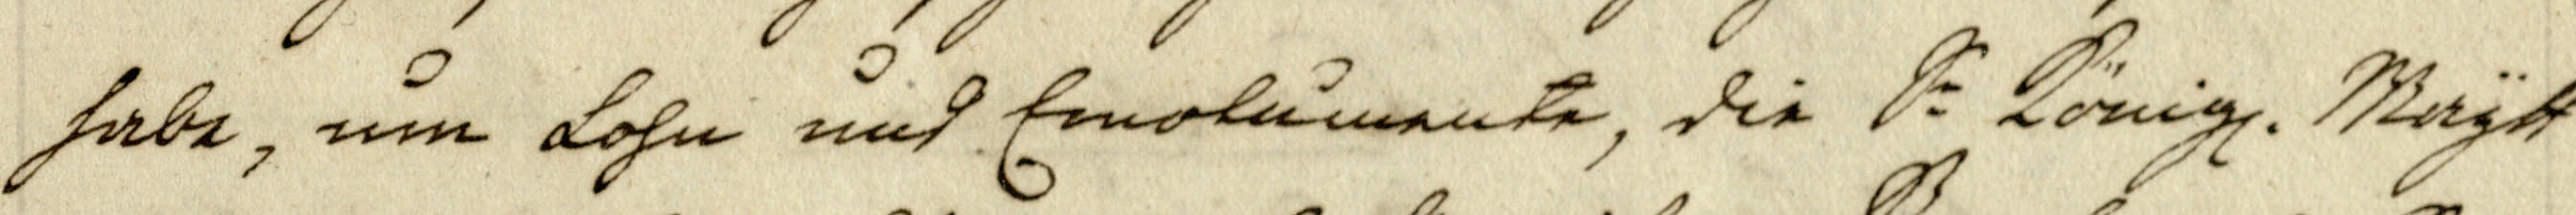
habe, um Lohn und Emolumente, die Sr Königl. Maÿtt.
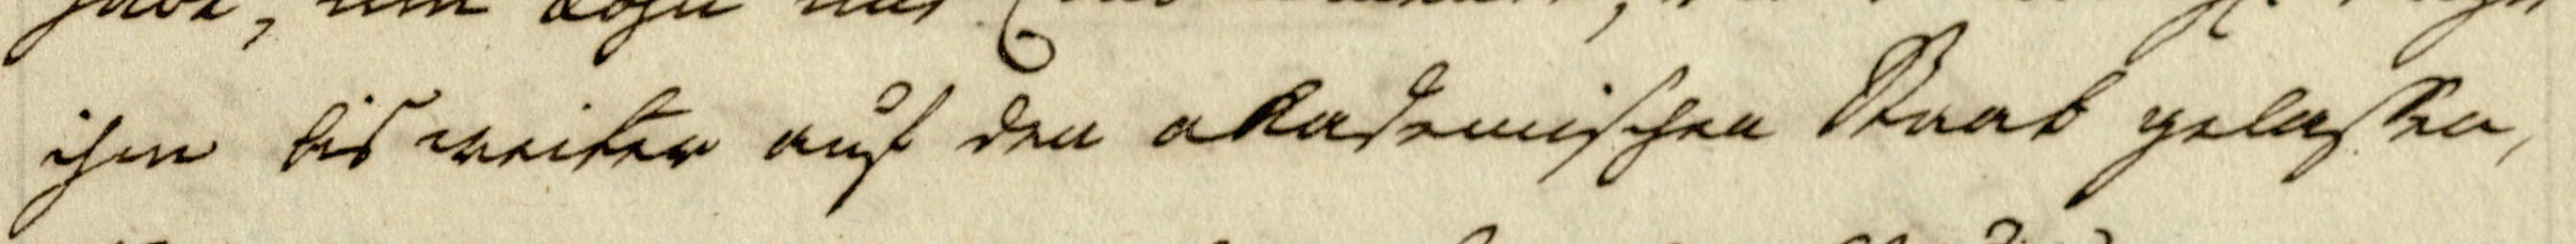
ihm bis weiter auf den akademischen Staat gelassen,
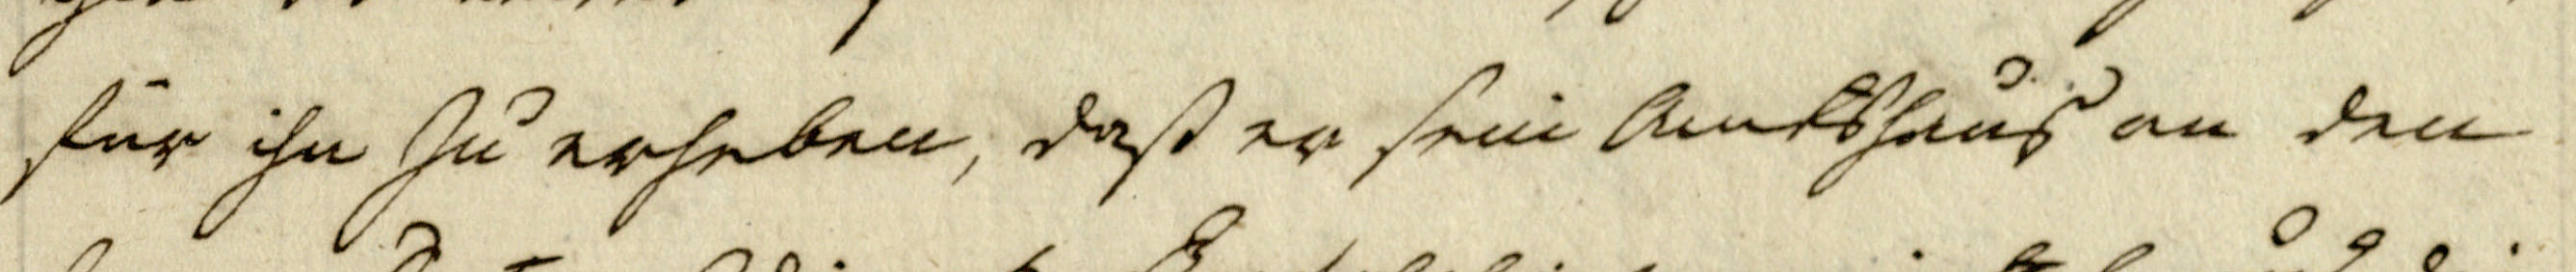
für ihn zu erheben, daß er sein Anmtshaus an den
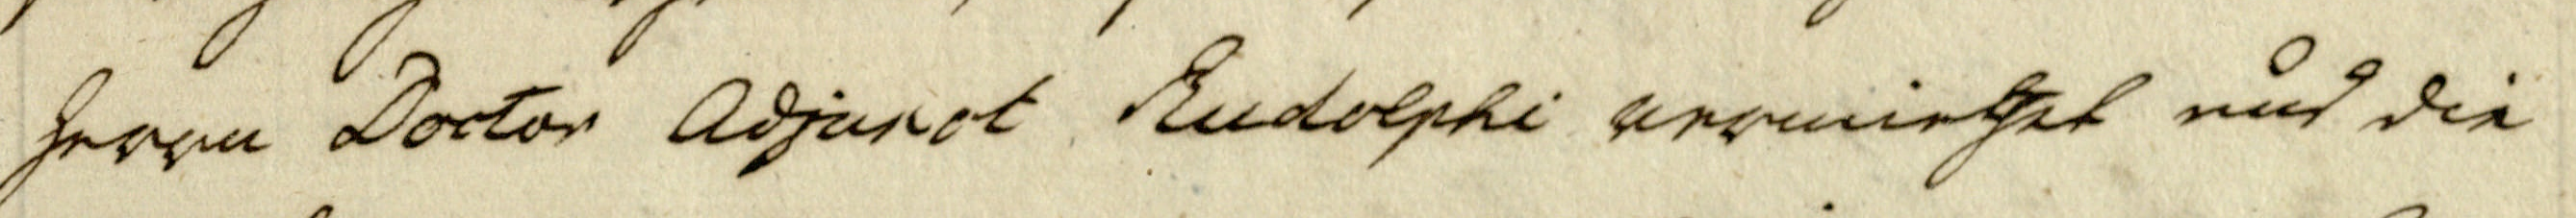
Herrn Doctor Adjunct Rudolphi vermiethet und die
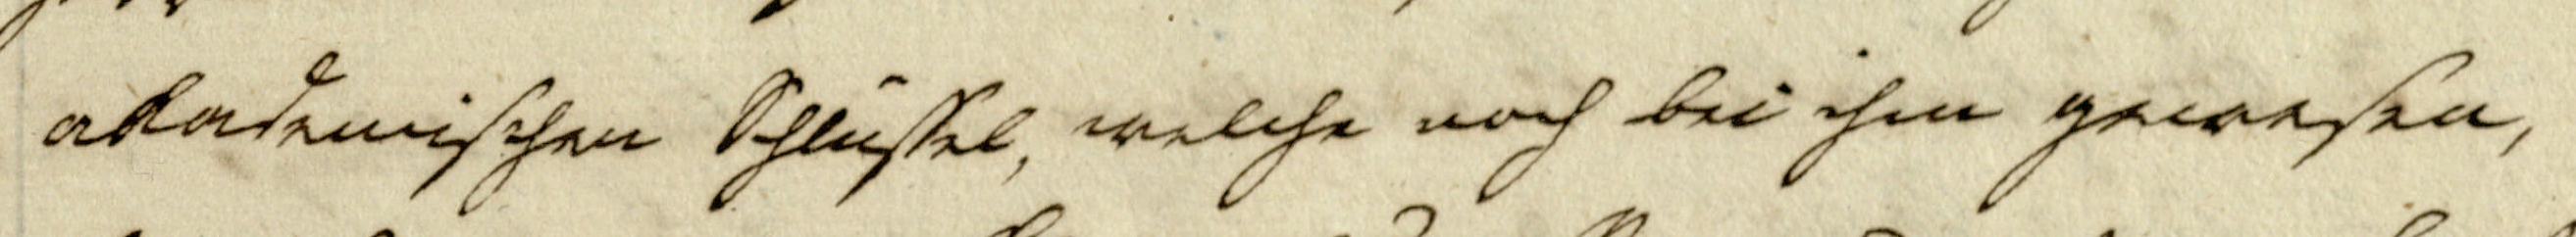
akademischen Schlüssel, welche noch bei ihm gewesen,
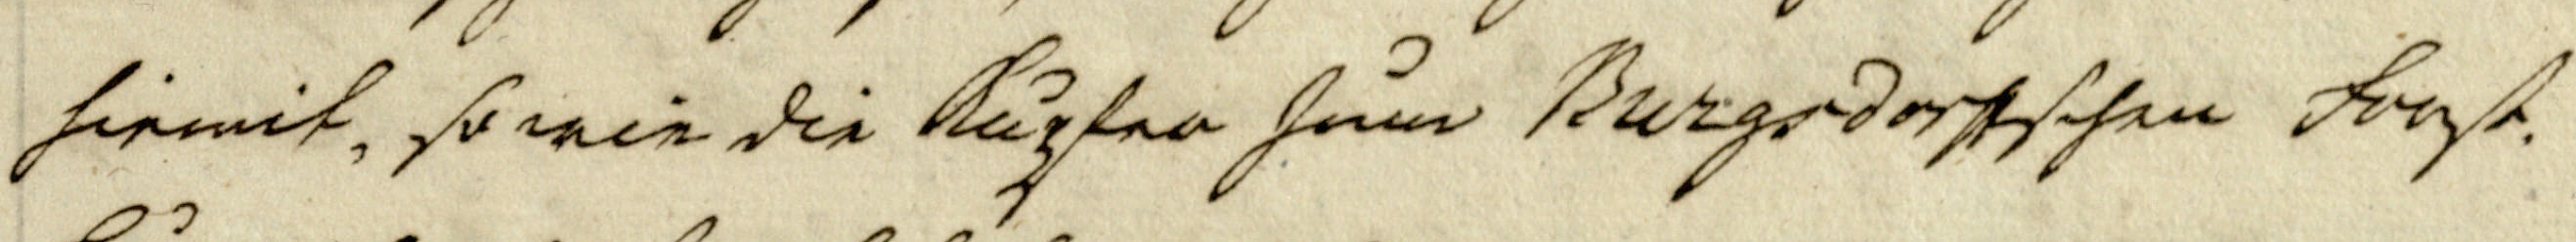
hiemit, so wie die Kupfer zum Burgsdorffschen Forst-
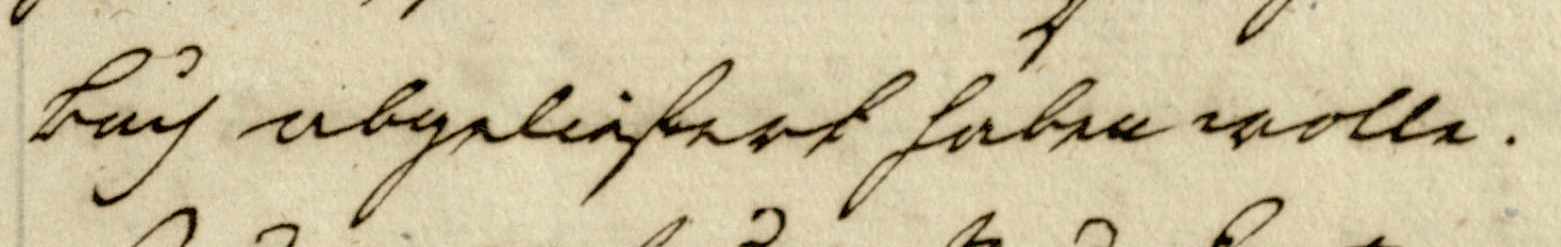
Buch abgeliefert haben wolle.
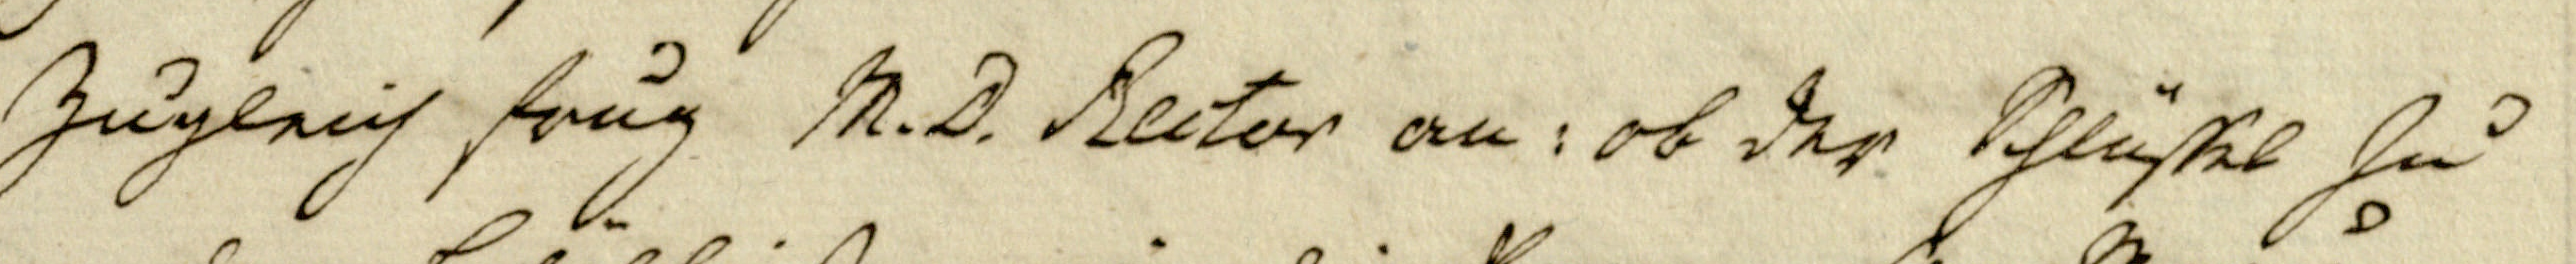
Zugleich frug M. D. Rector an: ob der Schlüssel zu
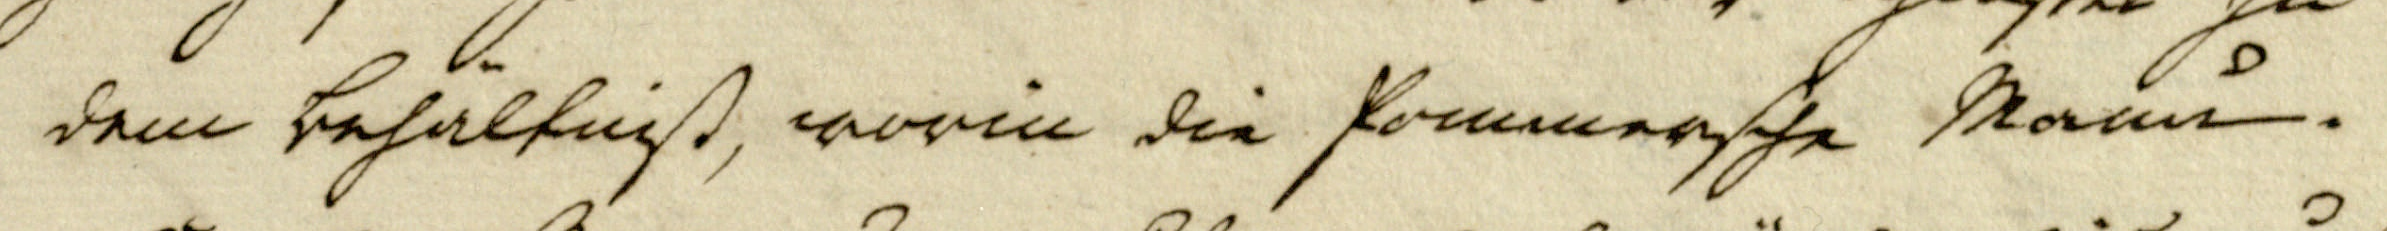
dem Behältniß, worin die Pommerschen Manu¬
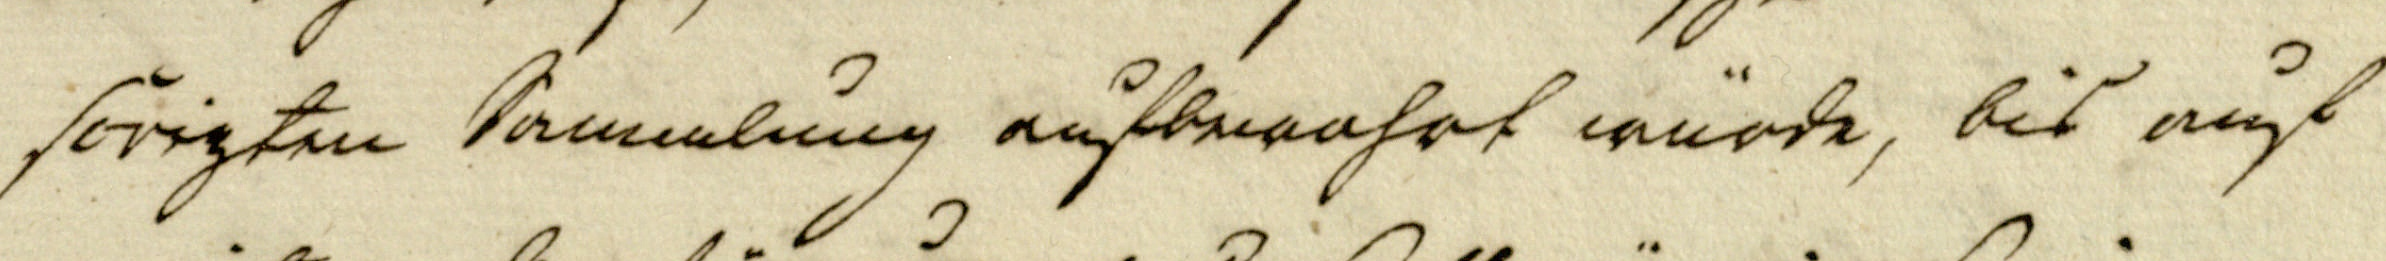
scripten Sammlung aufbewahrt würde, bis auf
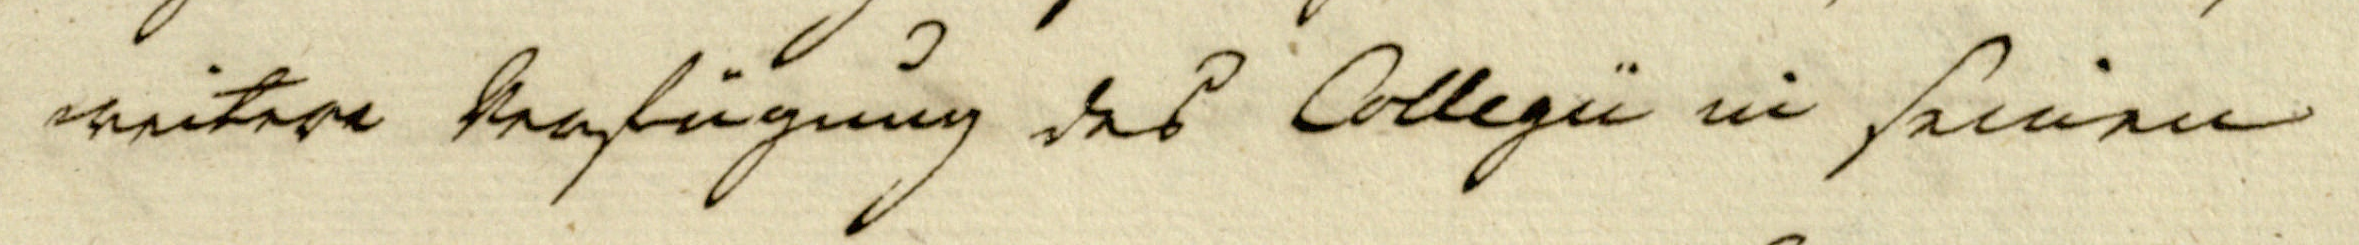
weitere Verfügung des Collegii in seinen
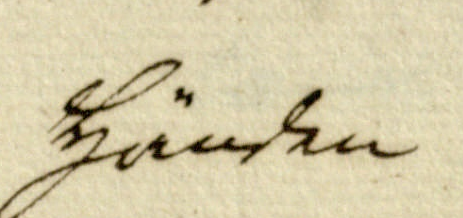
Händen
